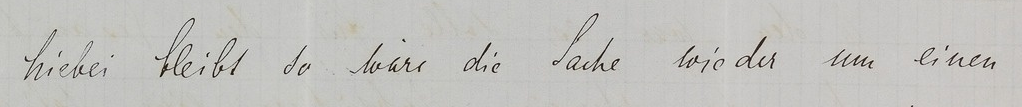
hiebei bleibt so wäre die Sache wieder um einen
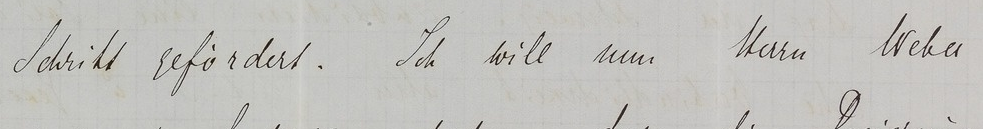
Schritt gefördert. Ich will nun Herrn Weber
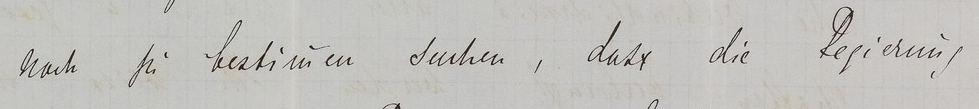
noch zu bestimmen suchen, dass die Regierung
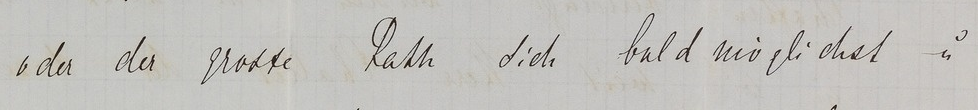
oder der grosse Rath sich bald möglichst u
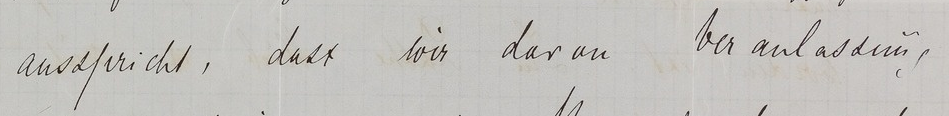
ausspricht, dass wir daran Veranlassung
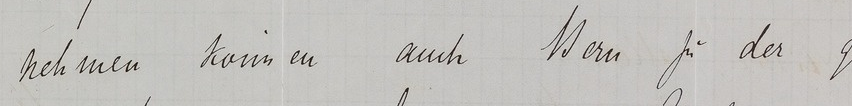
nehmen können auch Bern zu der
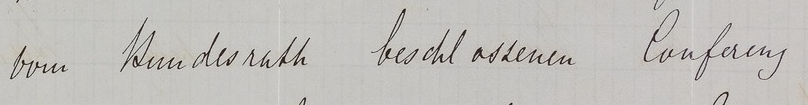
vom Bundesrath beschlossenen Conferenz
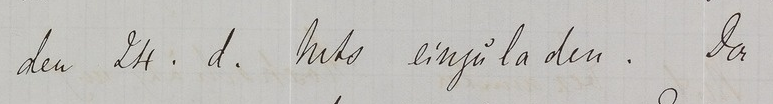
den 24. d. Mts einzuladen. Der
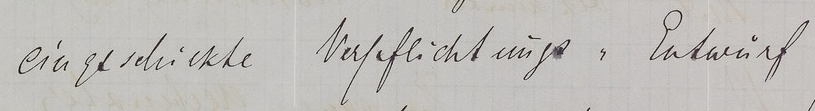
eingeschickte Verpflichtungs-Entwurf
